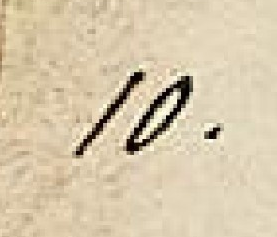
10.
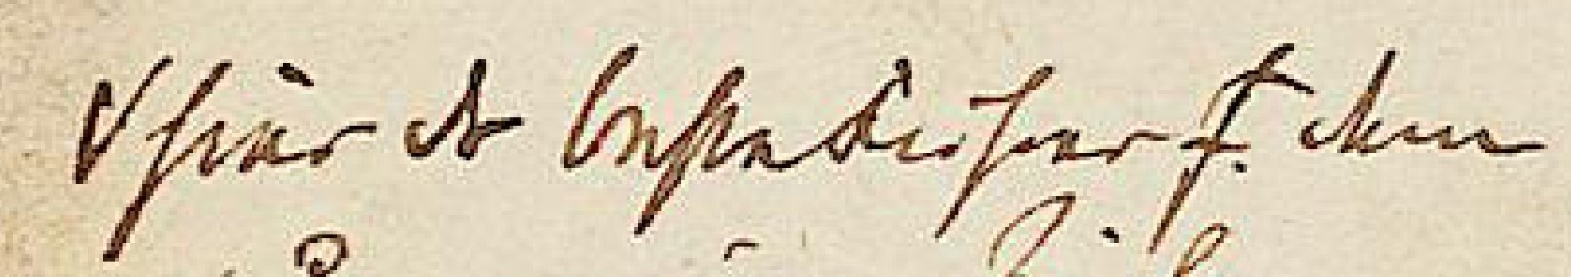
V hier dr beste Führer f dem
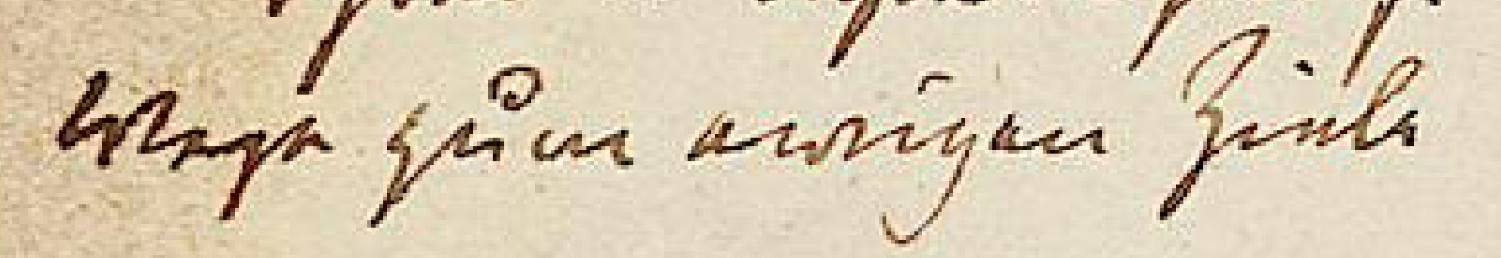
Wege zum ewigen Ziele
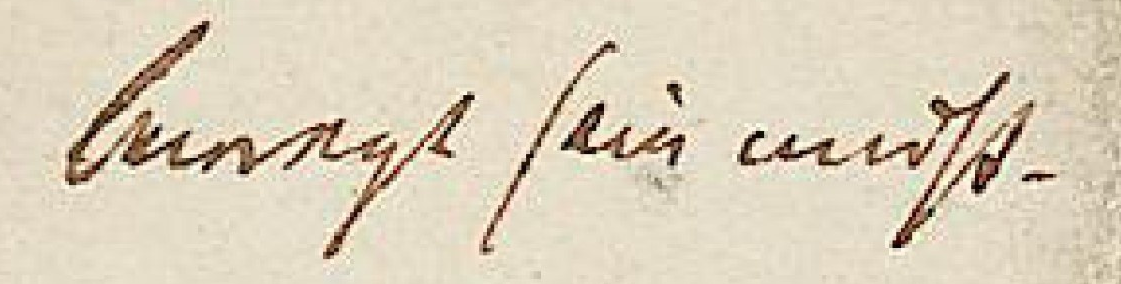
bewegt sein müßt.
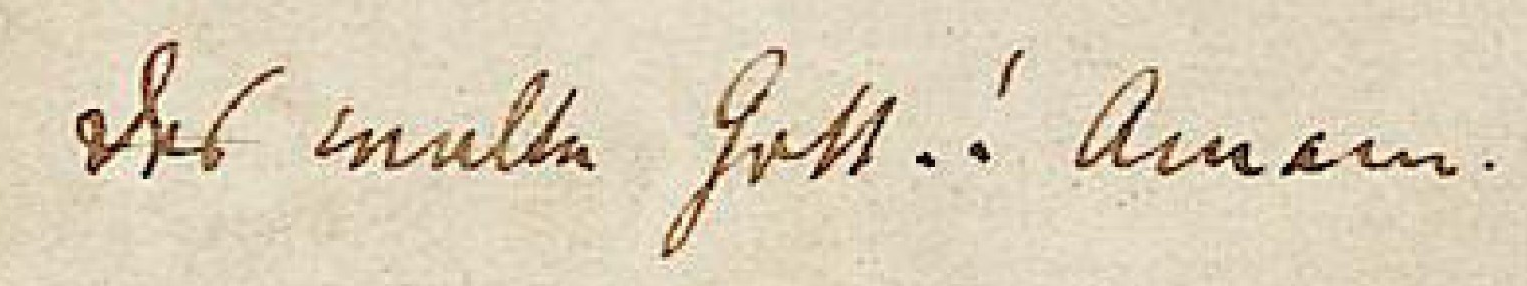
das walte Gott.! Amen
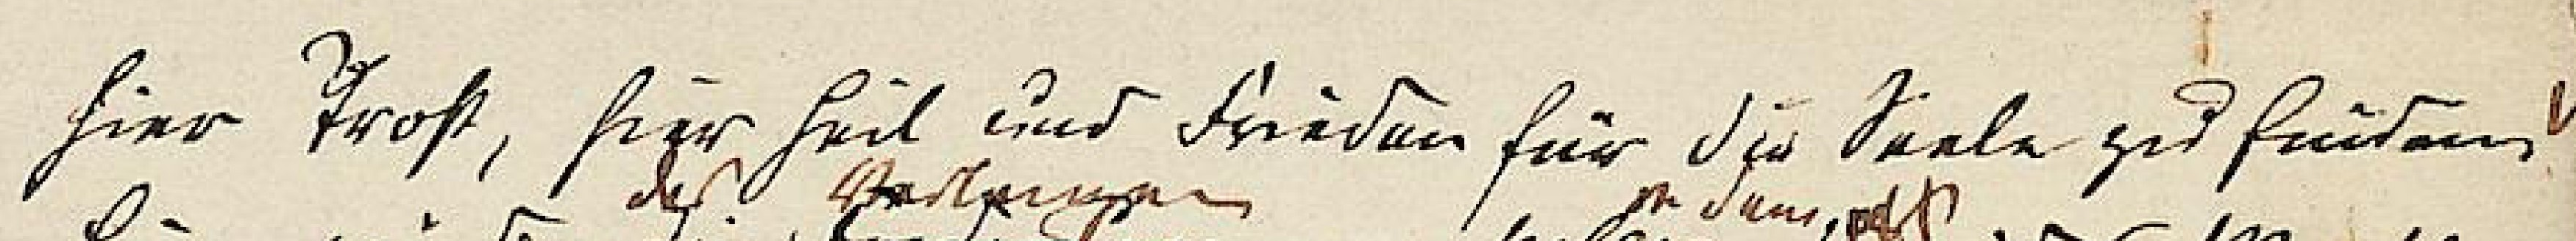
hier Trost, hier Heil und Frieden für die Seele zu finden
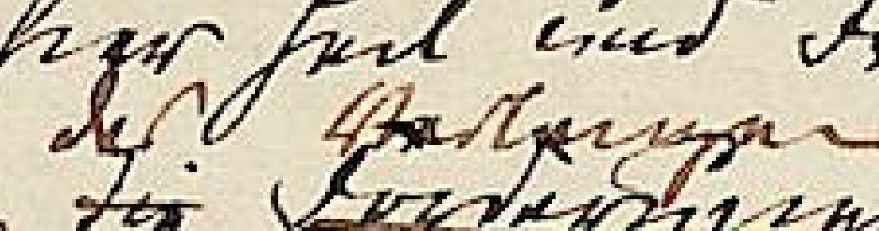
das Verlangen
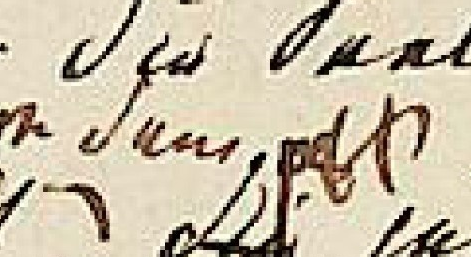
n. dem
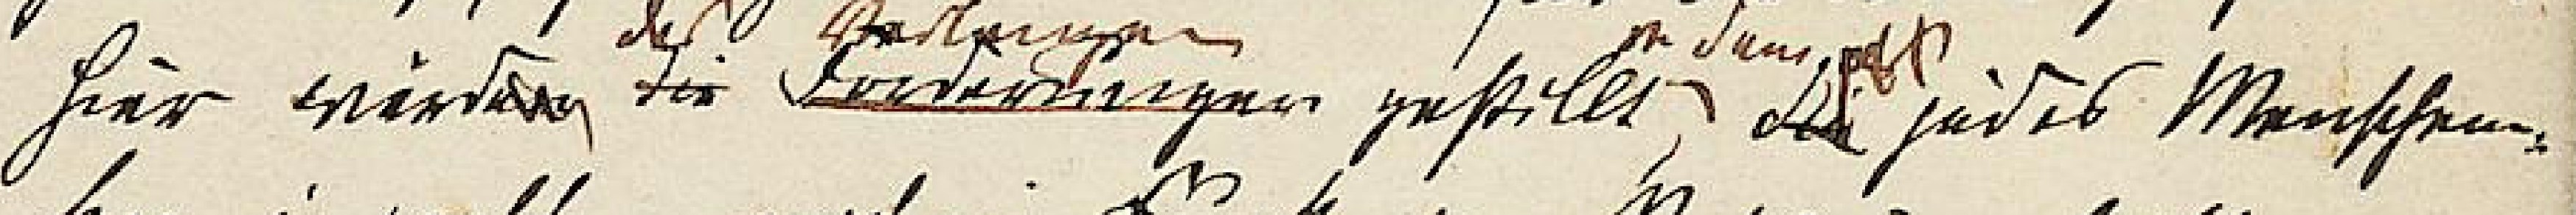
Hier wirden die Forderungen gestillt, die jedes Menschen¬
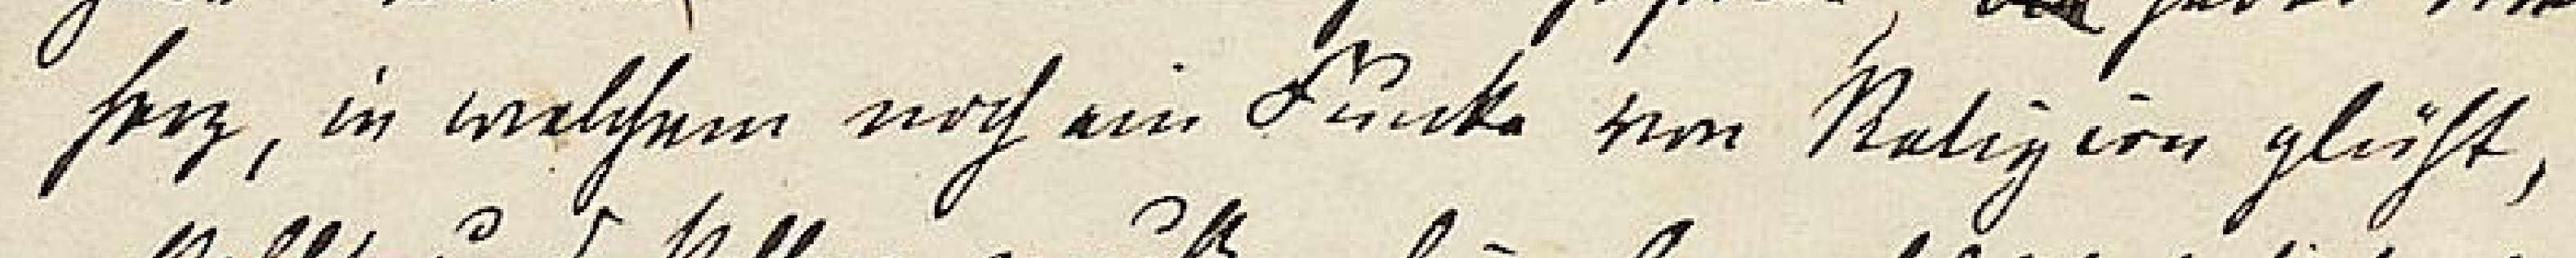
herz, in welchem noch ein Fuke von Religion glüht,
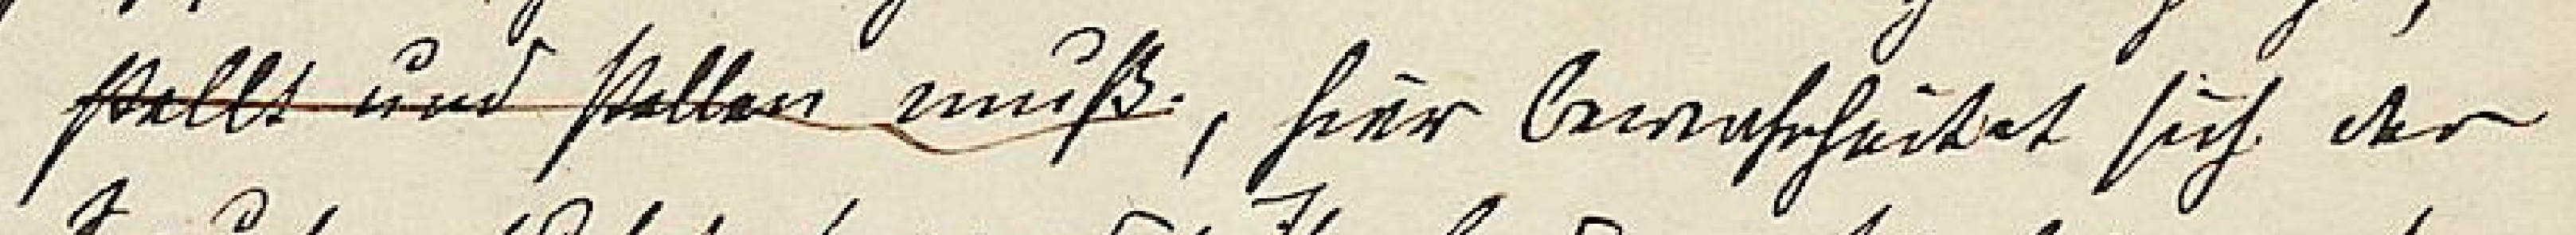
stellt und stellen muß, hier bewahrheitet sich der
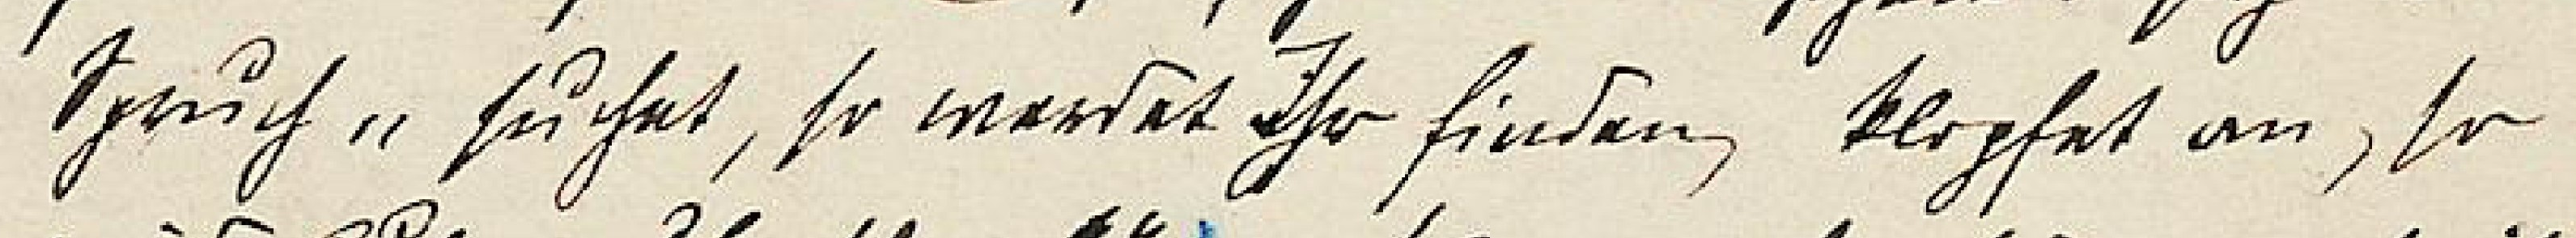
Spruch "suchet, so werdet Ihr finden, klopfet an, so
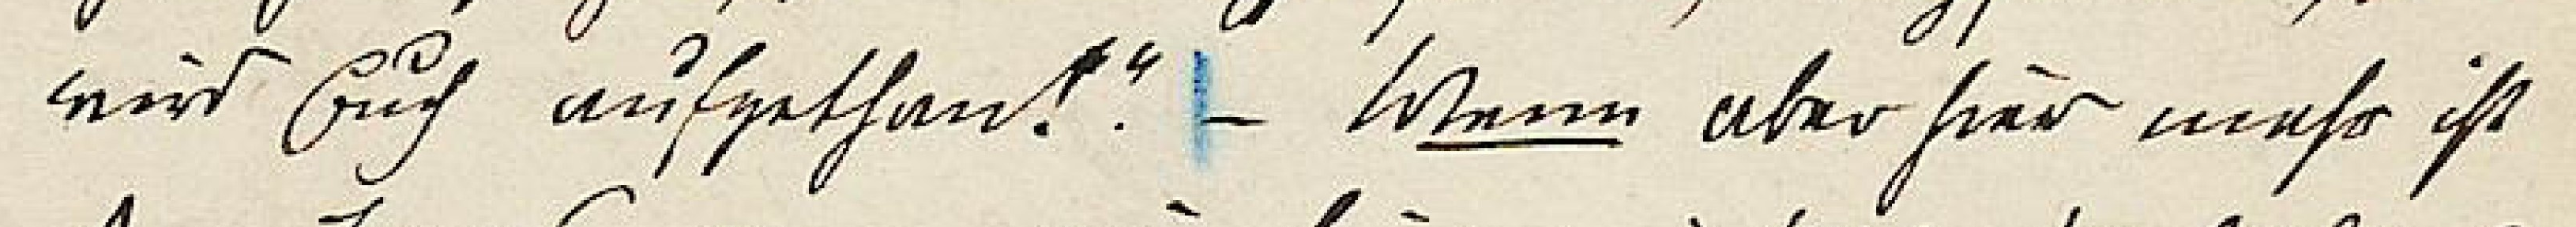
wird Euch aufgethan!" Wenn aber hier mehr ist
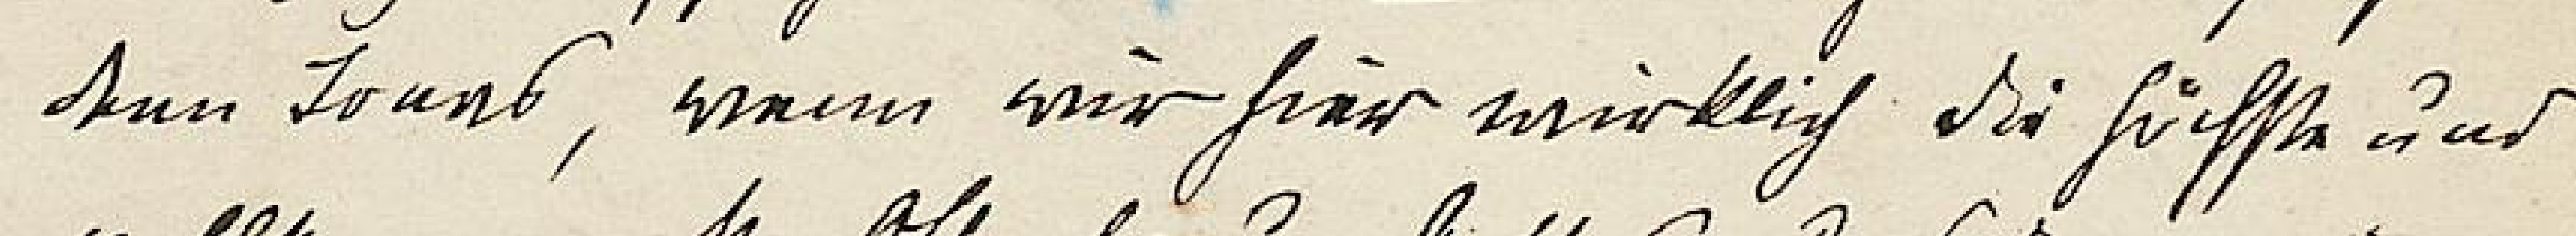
denn Jonas, wenn wir hier wirklich die höchste und
